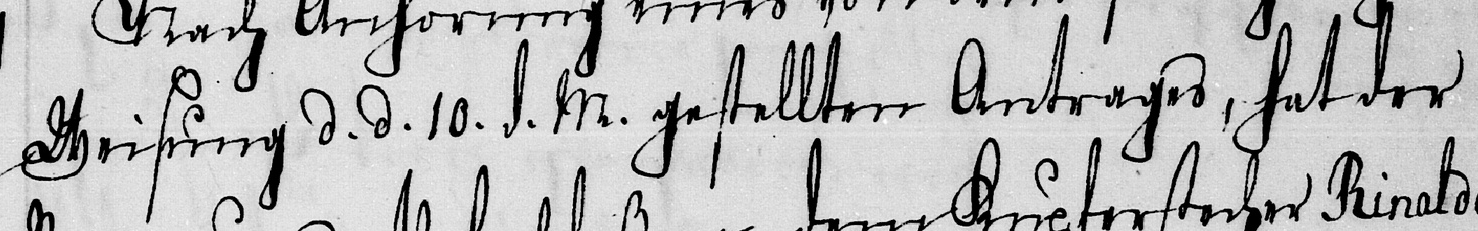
Weisung d. d. 10. d. M. gestellten Antrags, hat der
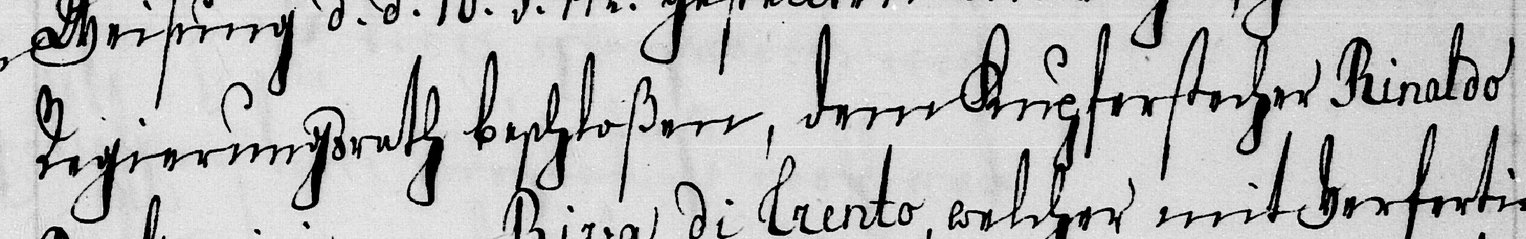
Regierungsrath beschloßen, dem Kupferstecher Rinaldo
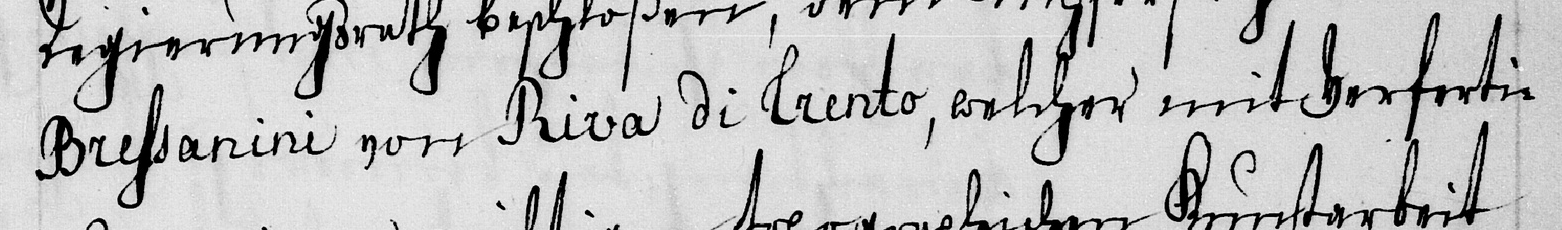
Bressanini von Riva di Trento, welcher mit Verferti¬
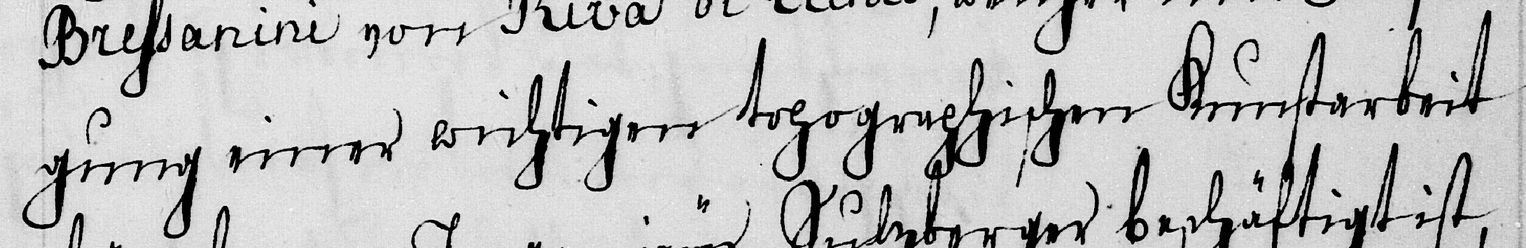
gung einer wichtigen topographischen Kunstarbeit
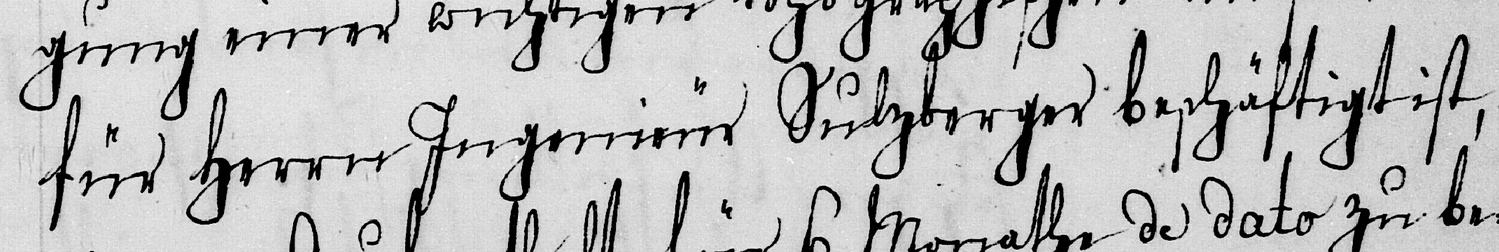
für Herrn Ingenieur Sulzberger beschäftigt ist,
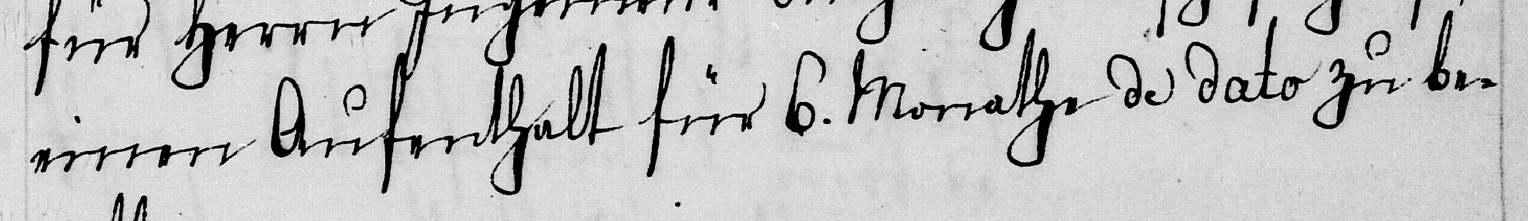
einen Aufenthalt für 6. Monathe de dato zu be¬
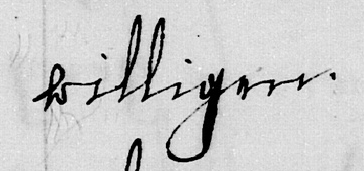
willigen.
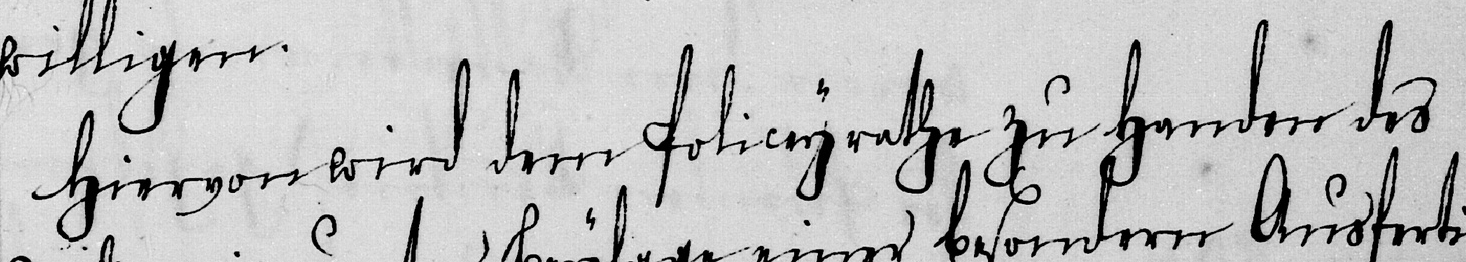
Hievon wird dem Policeyrathe zu Handen des
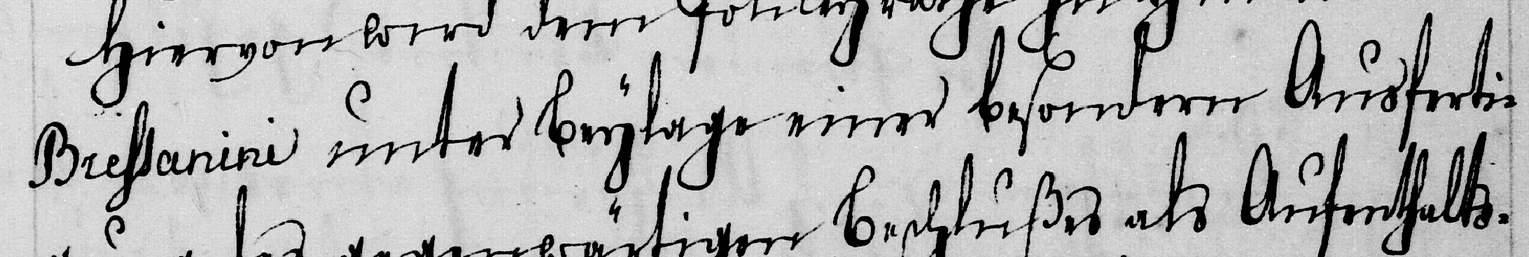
Bressanini unter Beylage einer besonderen Ausferti¬
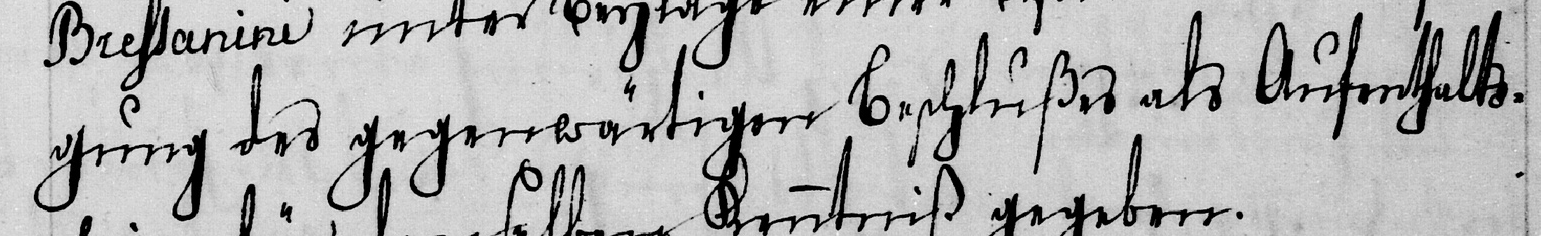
gung des gegenwärtigen Beschlußes als Aufenthalts¬
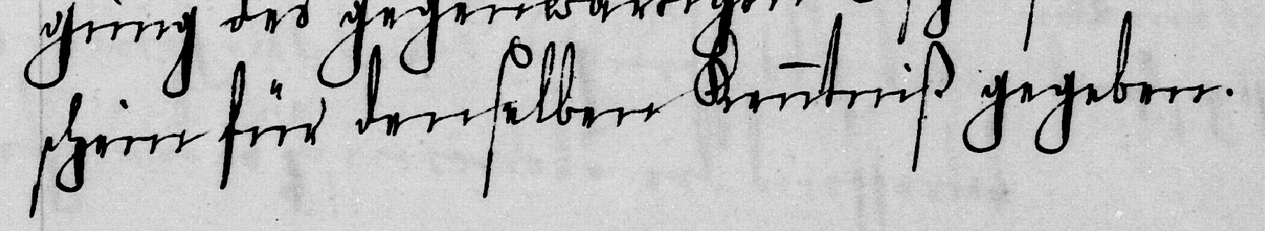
schein für denselben Kenntniß gegeben.
